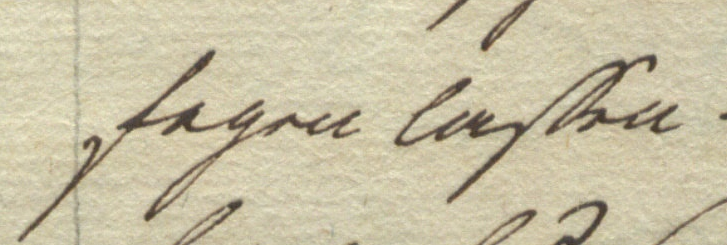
fegen lassen.
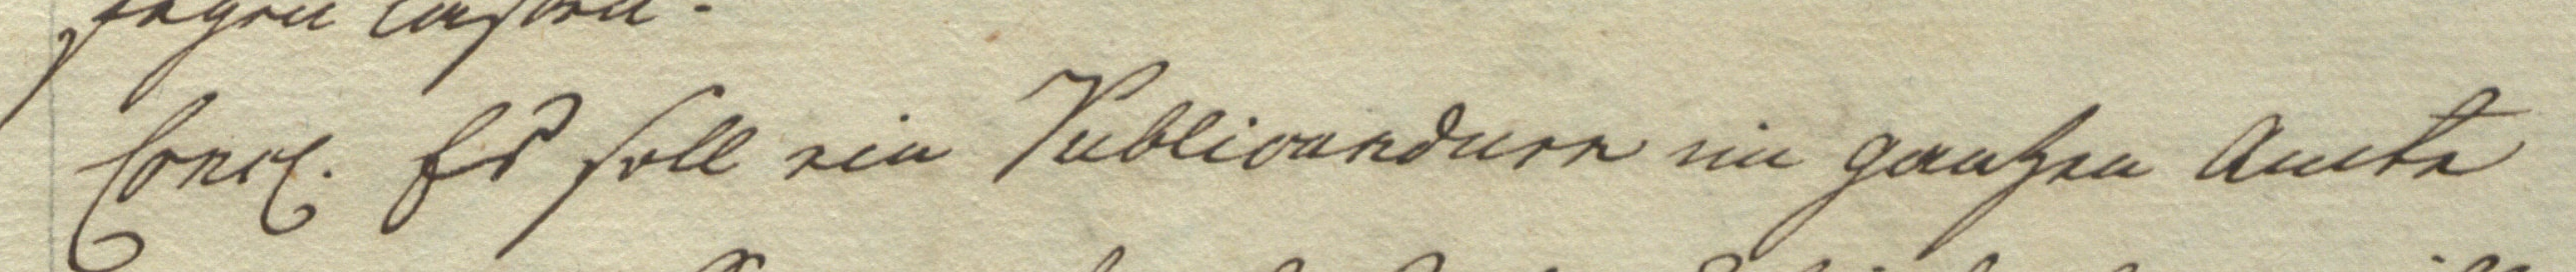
Concl. Es soll ein Publicandum im gantzen Amte
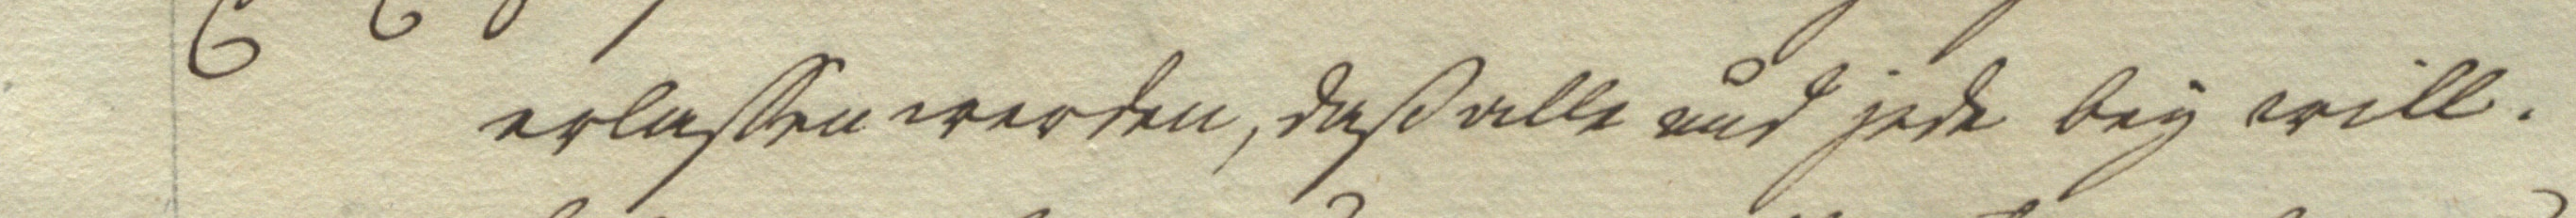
erlassen werden, daß alle und jede bey will¬
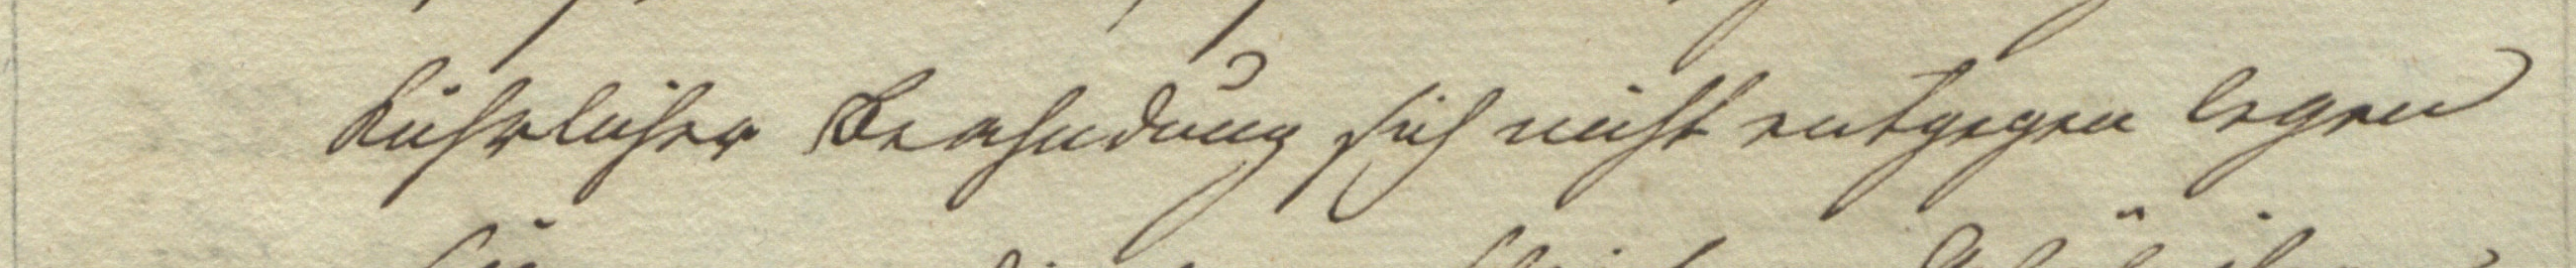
kührlicher Beahndung sich nicht entgegen legen
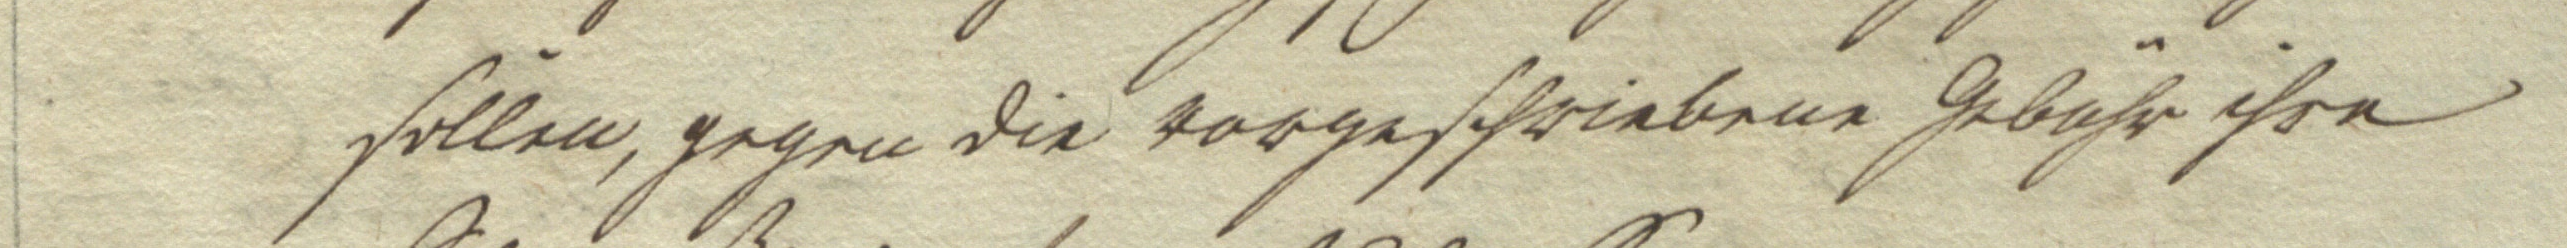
sollen, gegen die vorgeschriebene Gebühr ihre
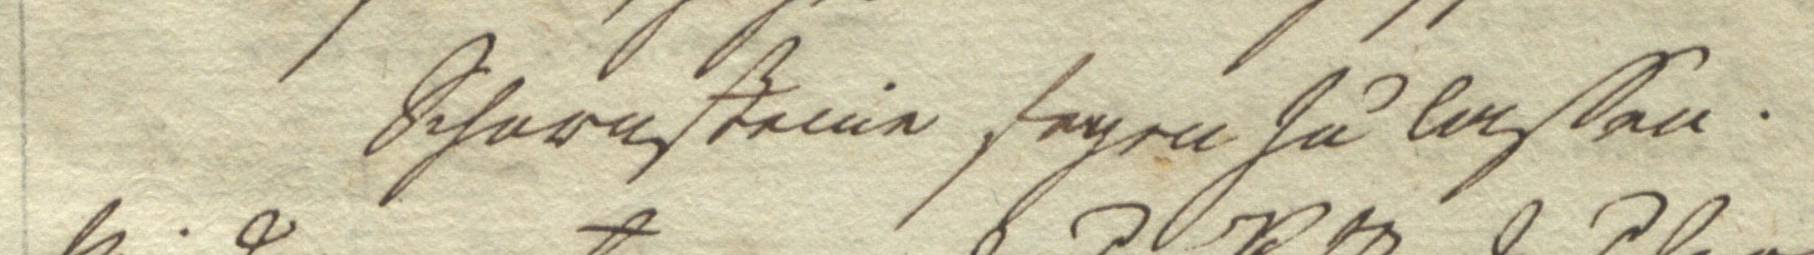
Schornsteine fegen zu lassen.
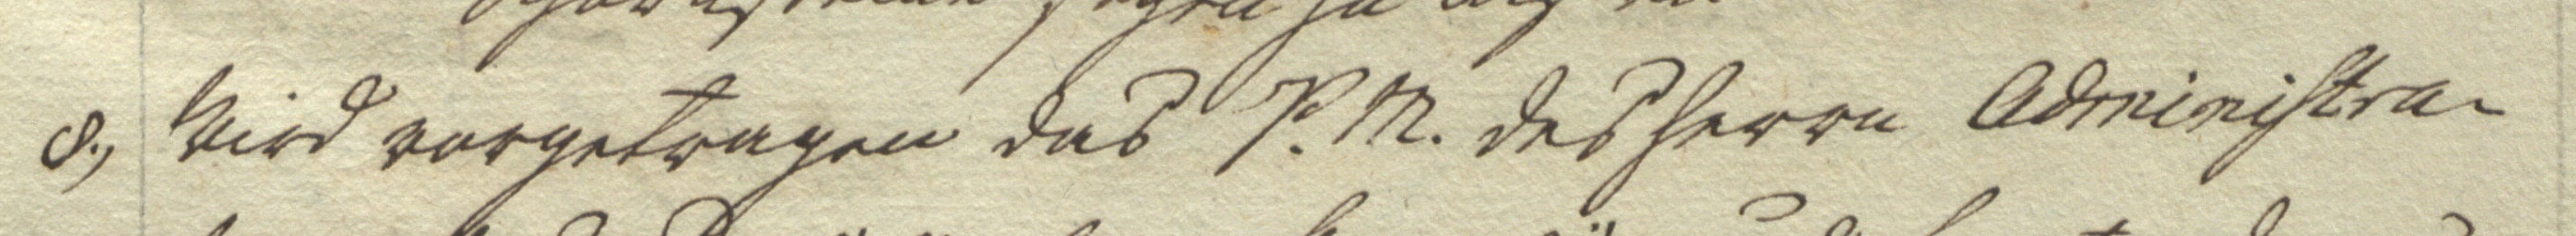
Wird vorgetragen das P. M. des Herrn Adeministra¬
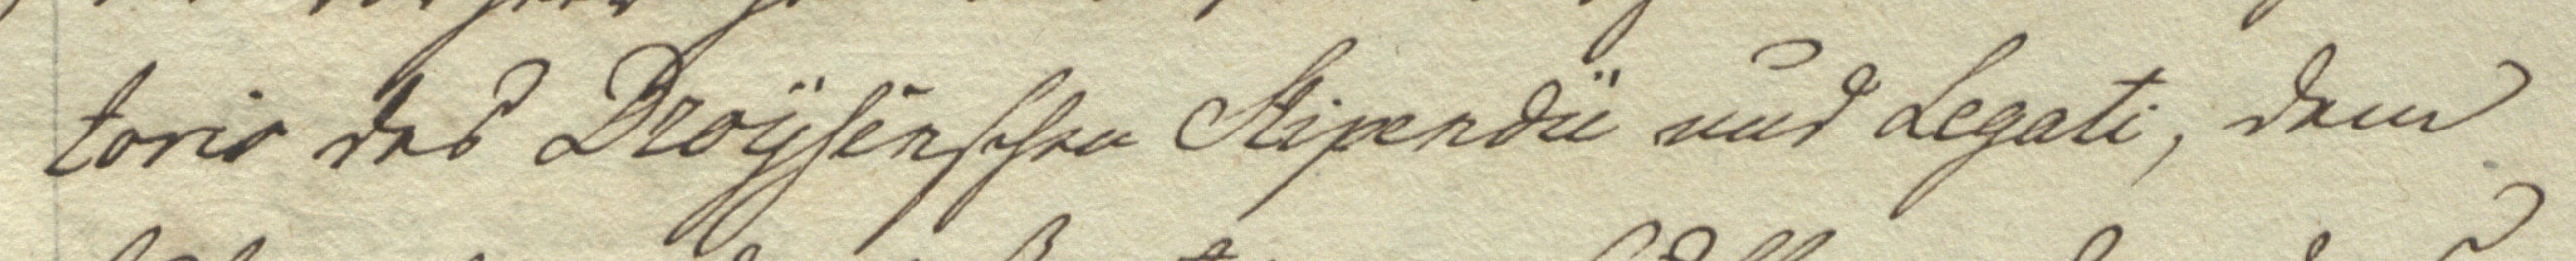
toris des Droysenschen Stipendii und Legati, dem
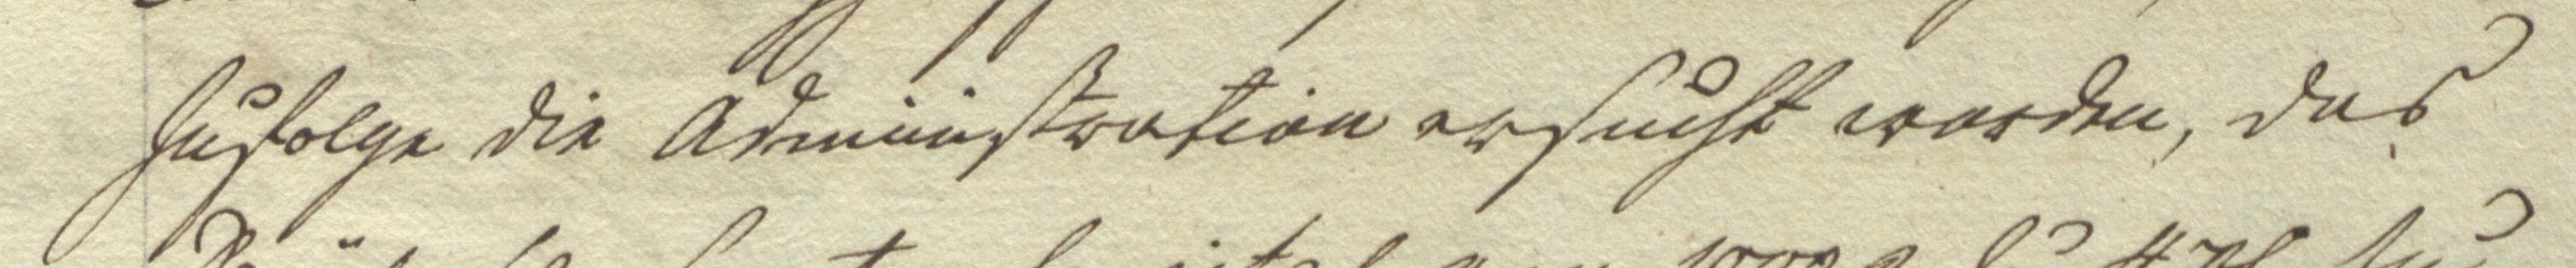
zufolge die Administration ersucht worden, das
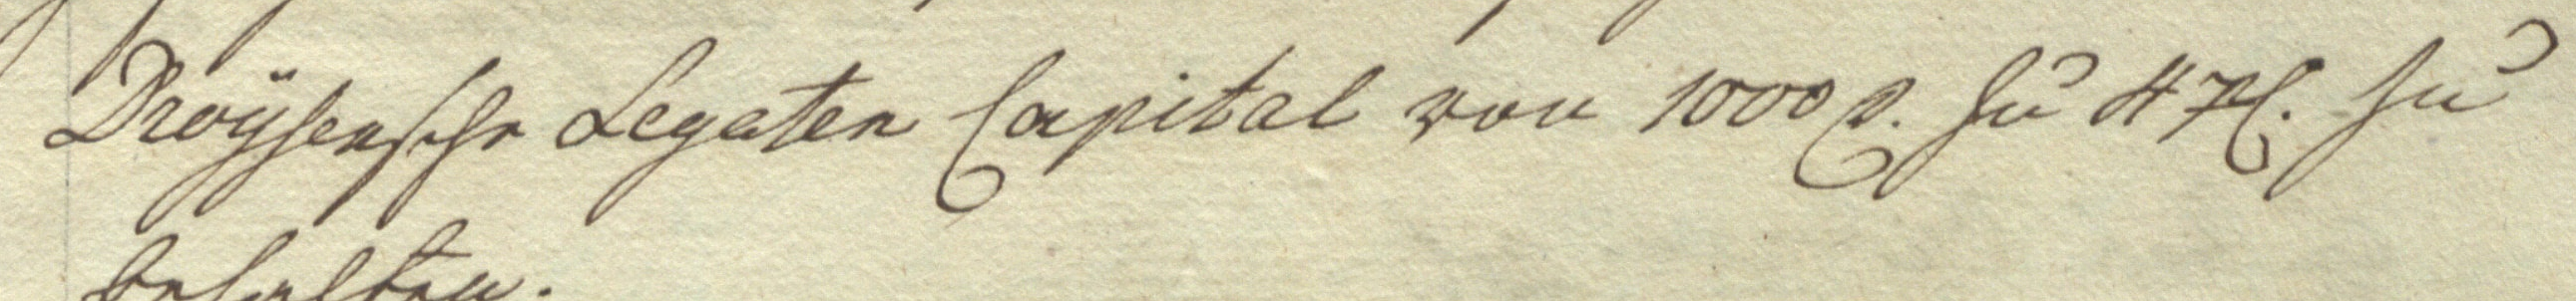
Droysensche Legaten Capital von 1000 rtl. zu 47 rtl. zu
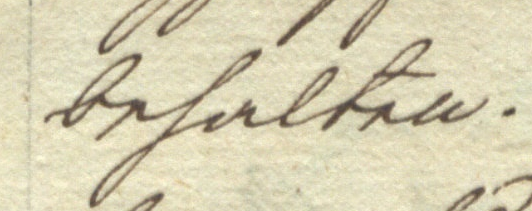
behalten.
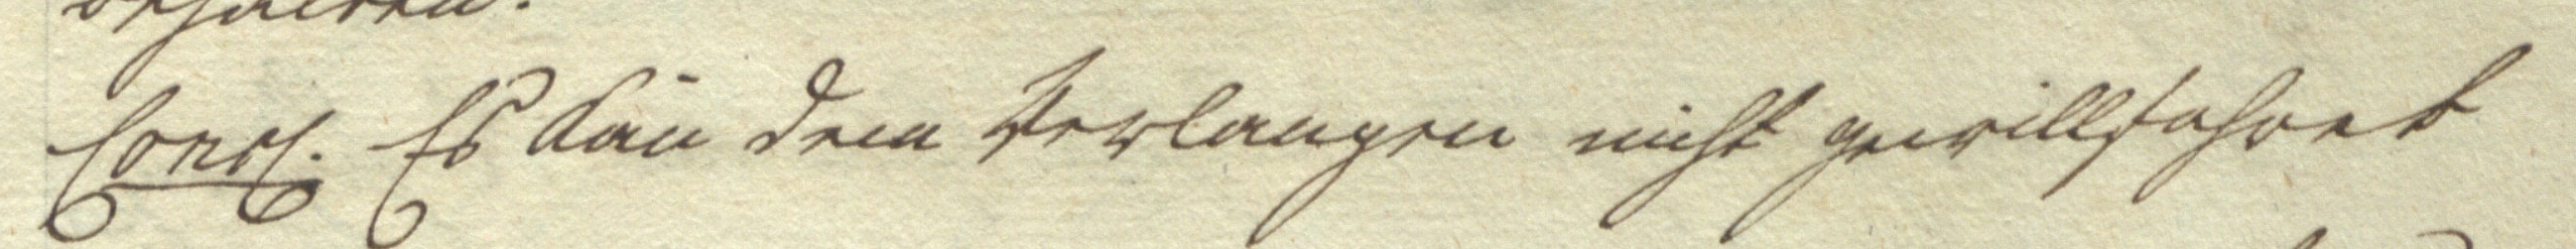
Concl. Es kan dem Verlangen nicht gewillfahret
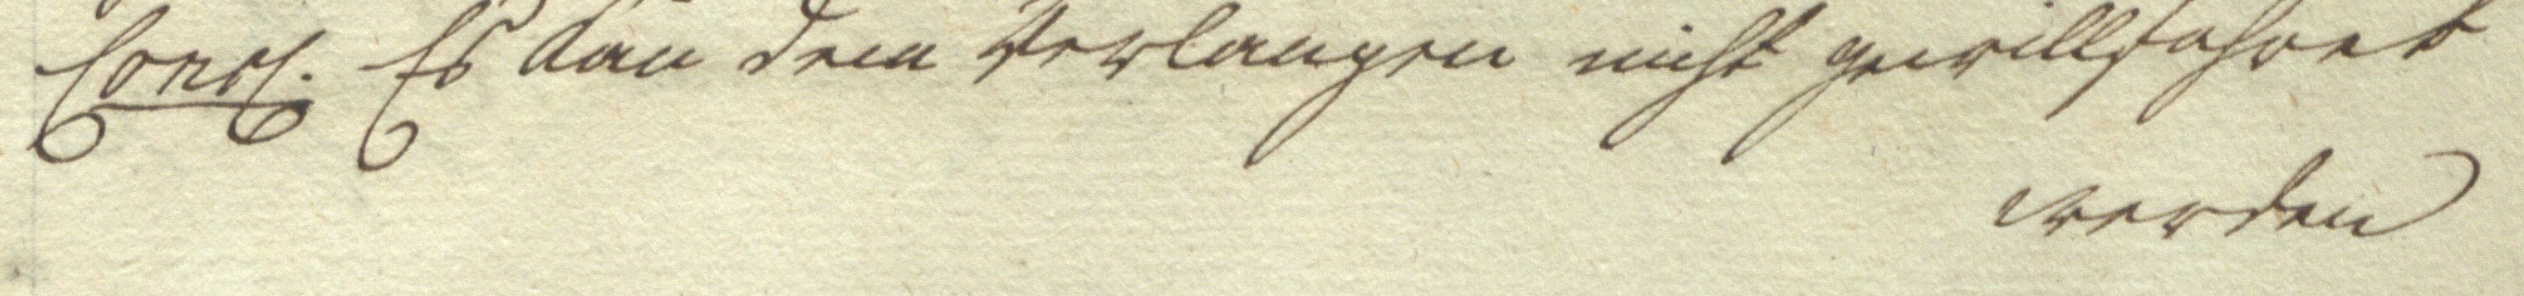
werden
